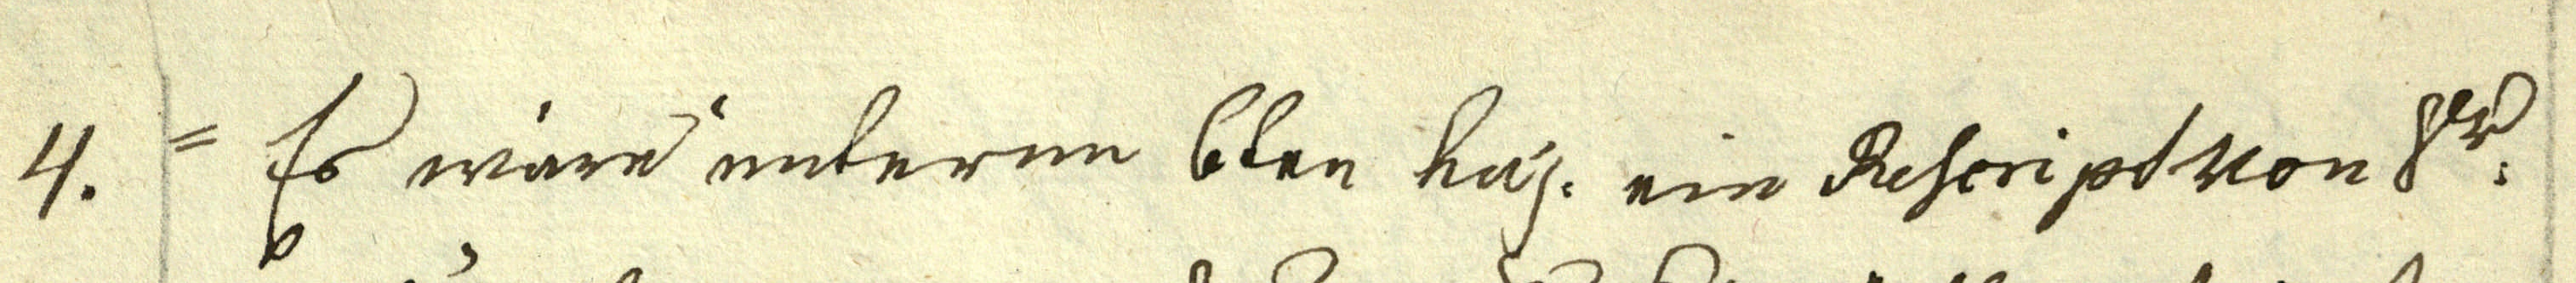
4. Es wäre unterm 6 ten huj. ein Rescript von Sr
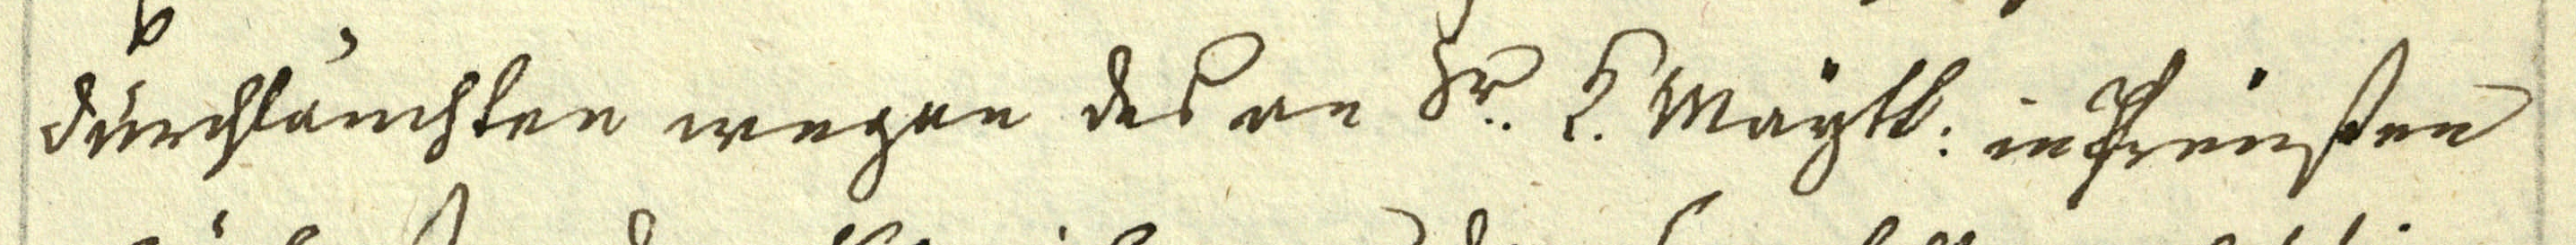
Durchlauchten wegen des an Sr. K. Maÿtt. in Preußen
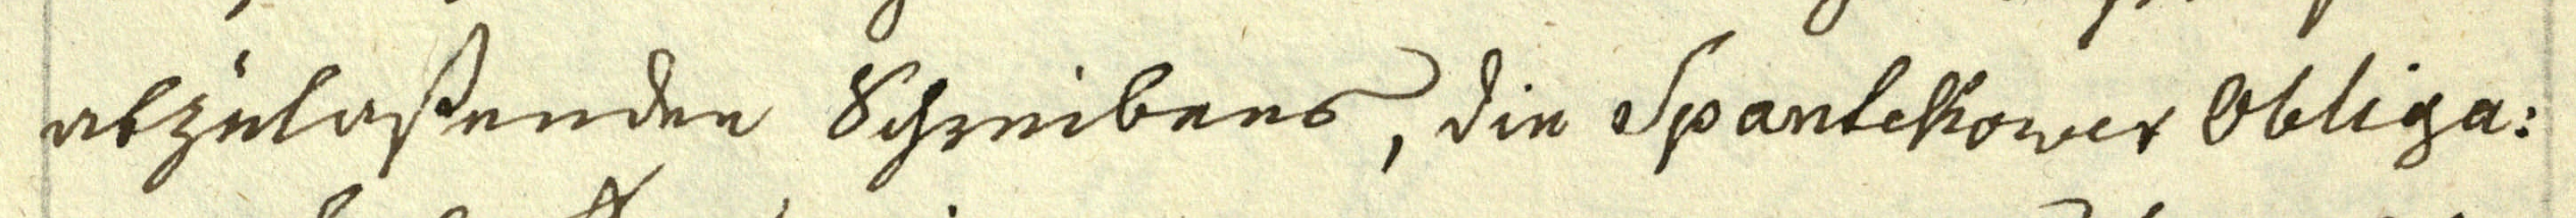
abzulaßenden Schreibens die Spantekower Obliga¬
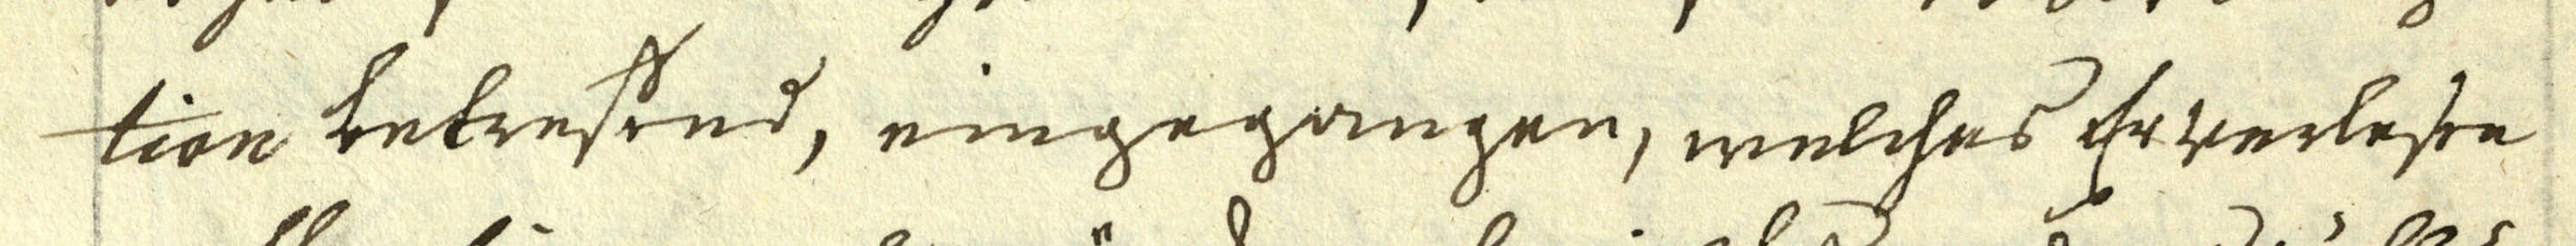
tion betreffend, eingegangen, welches Er verlesen
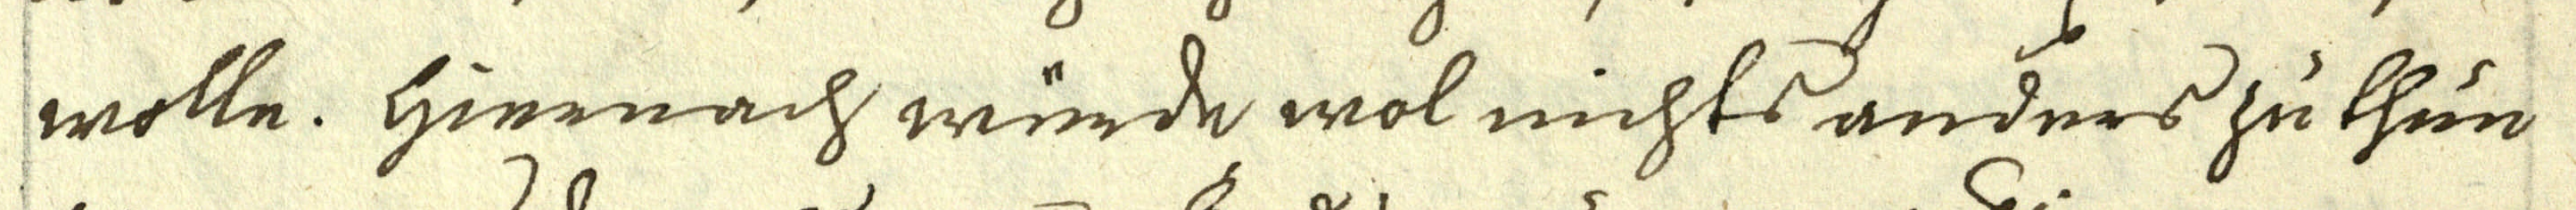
wolle. Hiernach würde wohl nichts anders zu thun
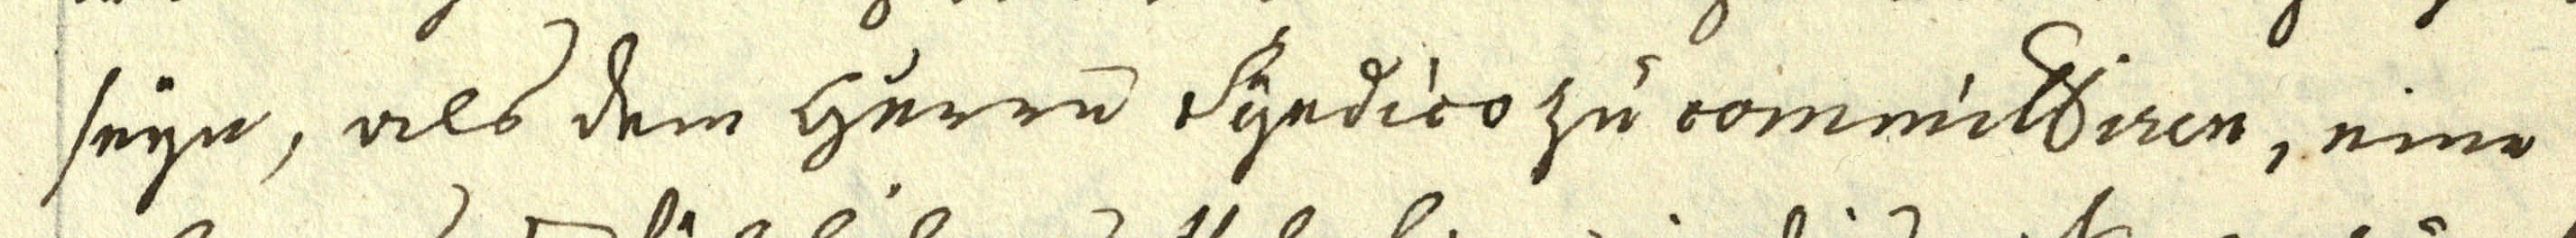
seÿn, als dem Herrn Sÿndico zu committiren, eine
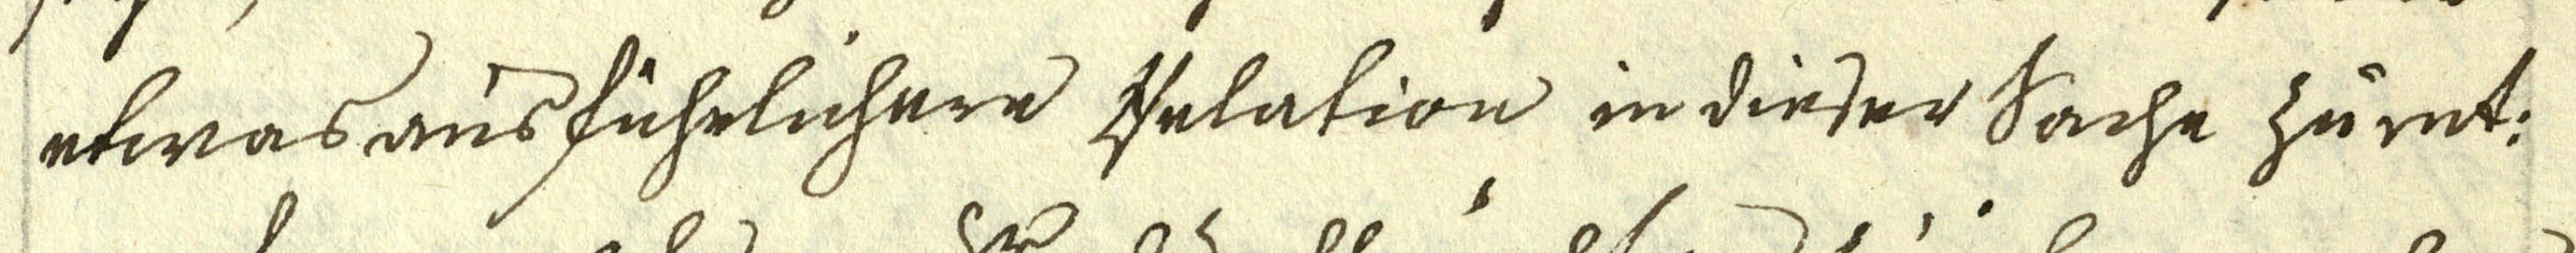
etwas ausführlichere Relation in dieser Sache zu ent¬
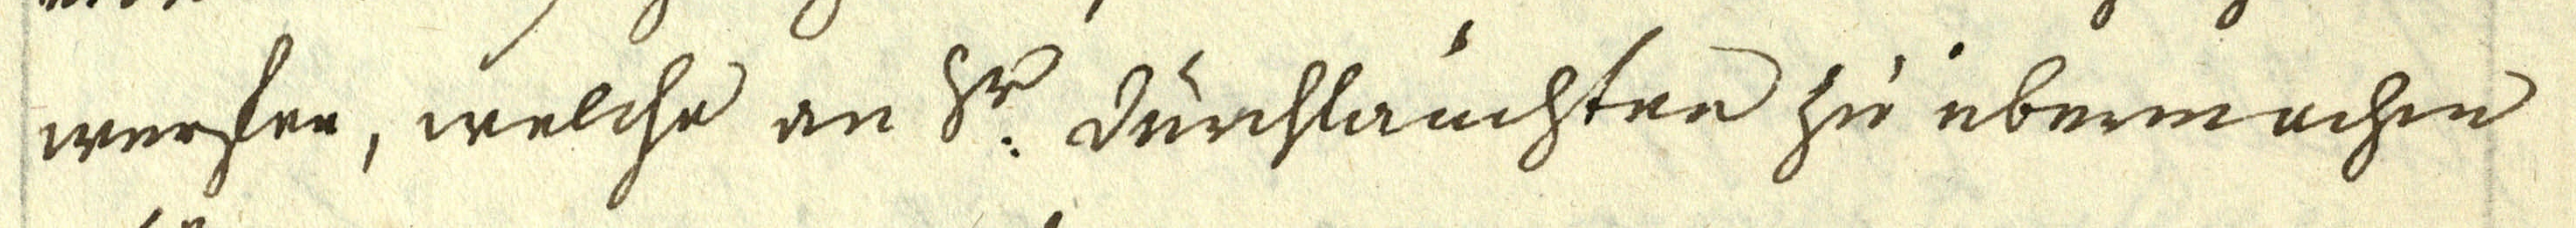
werfen, welche an Sr. Durchlauchten zu übermachen
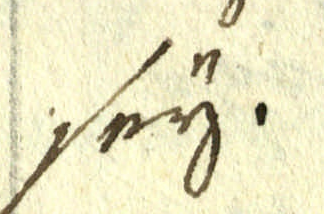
seÿ.
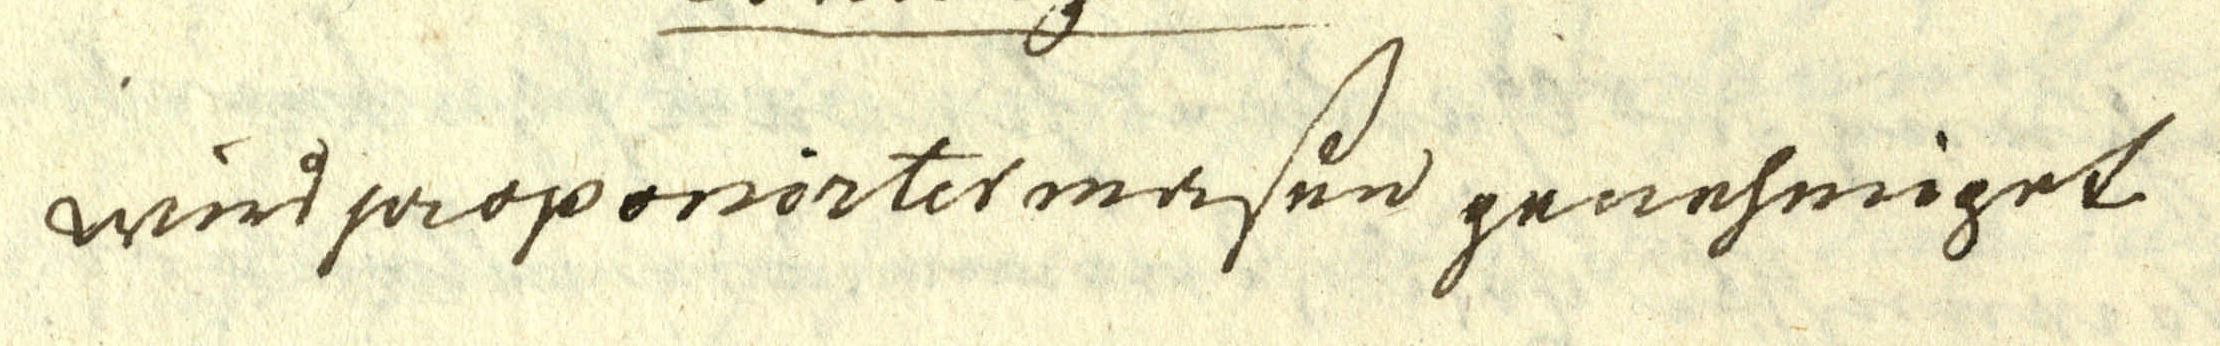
wird proponirter maßen genehmiget
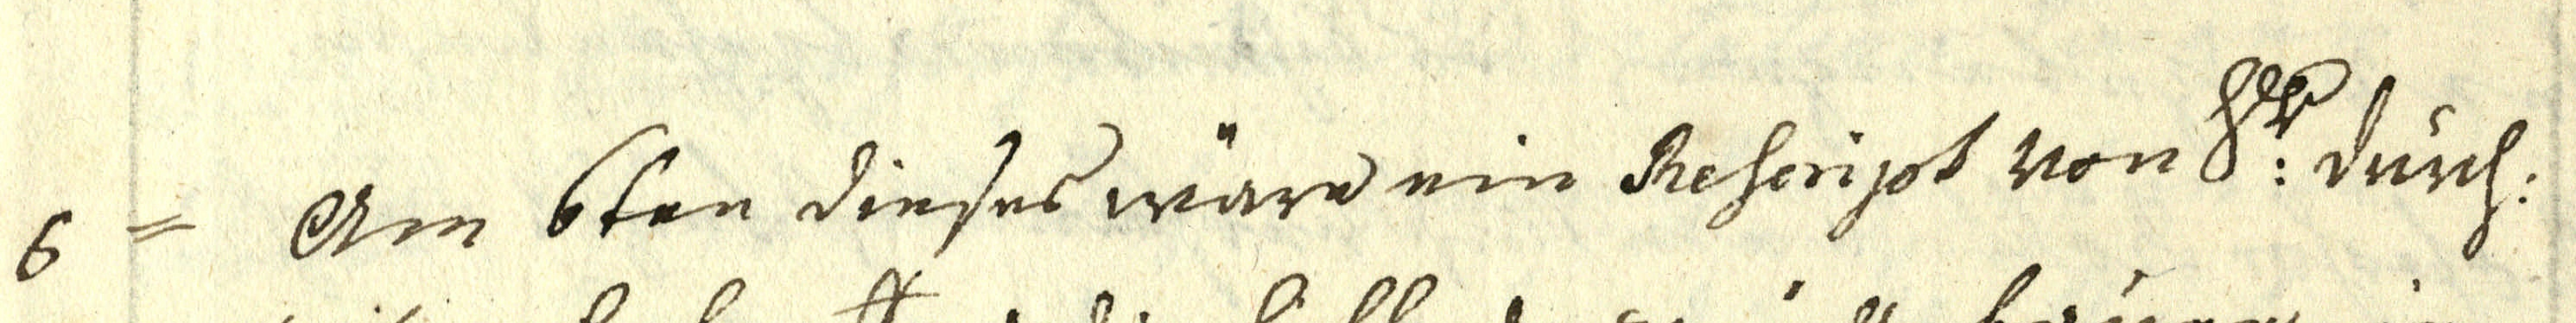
5. Am 6 ten dieses wäre ein Rescript von Sr. Durch¬
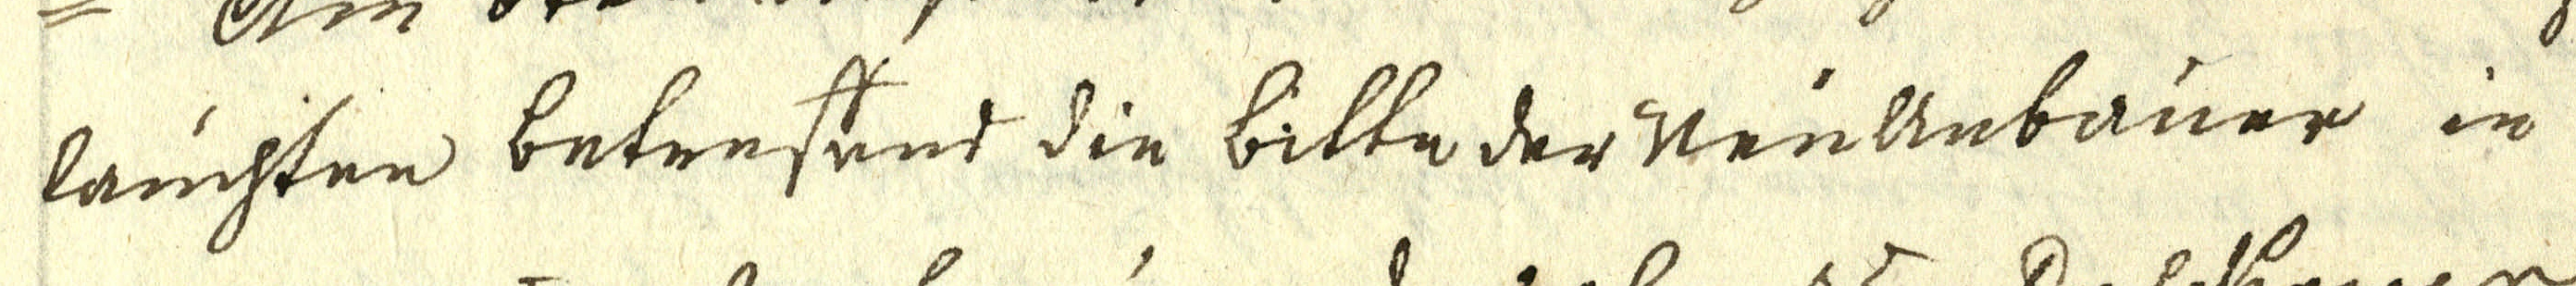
lauchten betreffend die Bitte der NeuAnbauer in
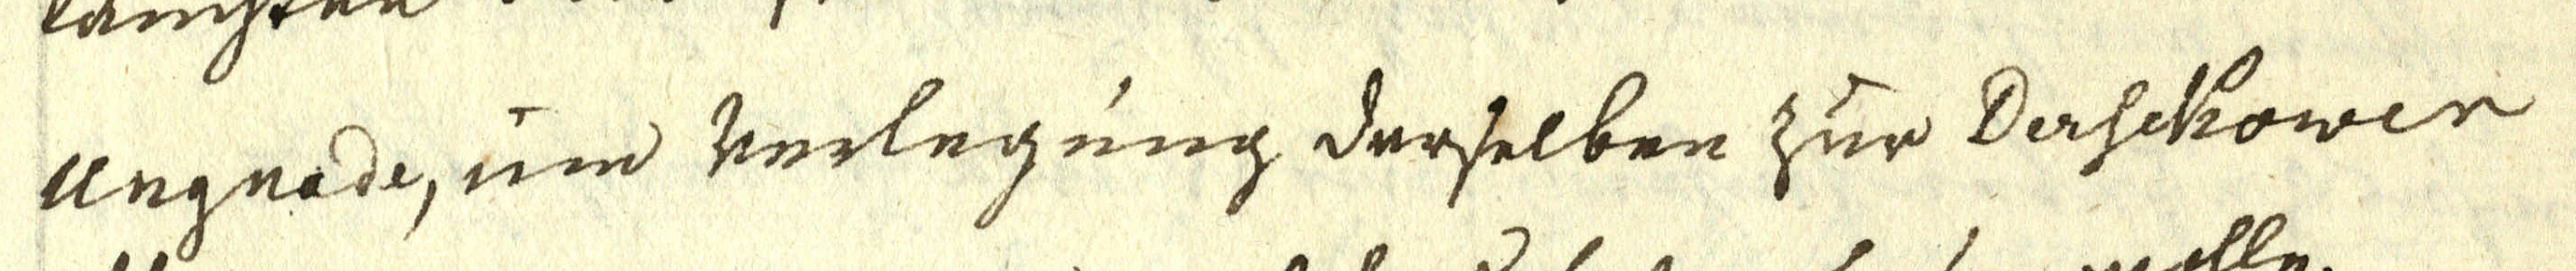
Ungnade, um Verlegung derselben zur Dersekower
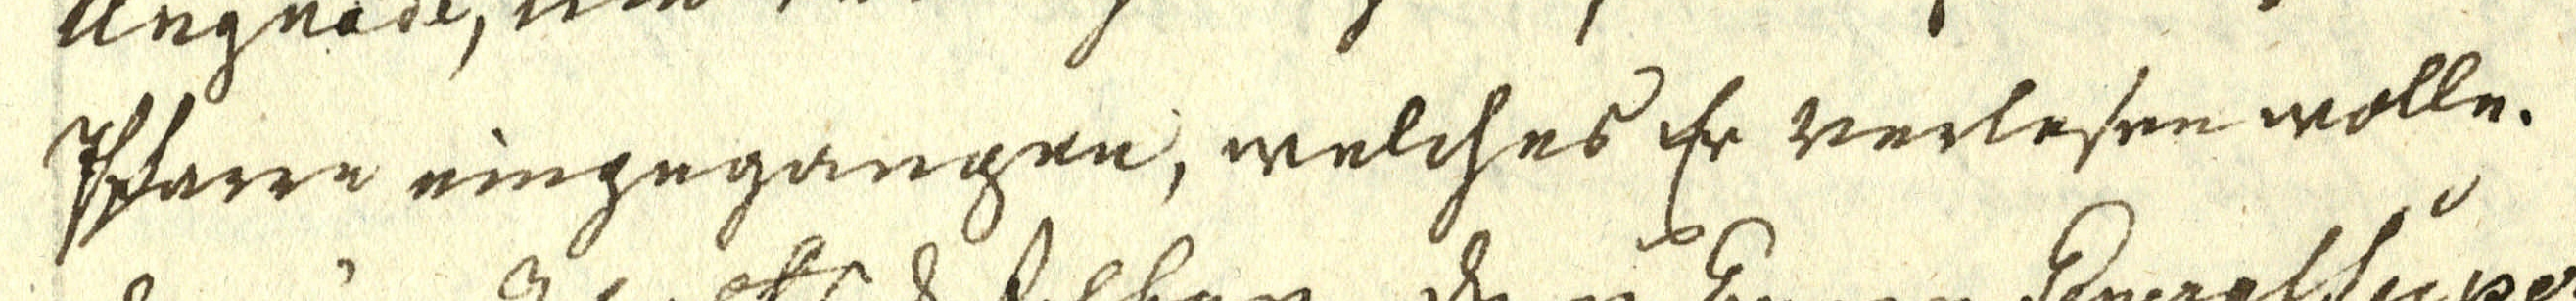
Pfarre eingegangen, welches Er verlesen wolle.
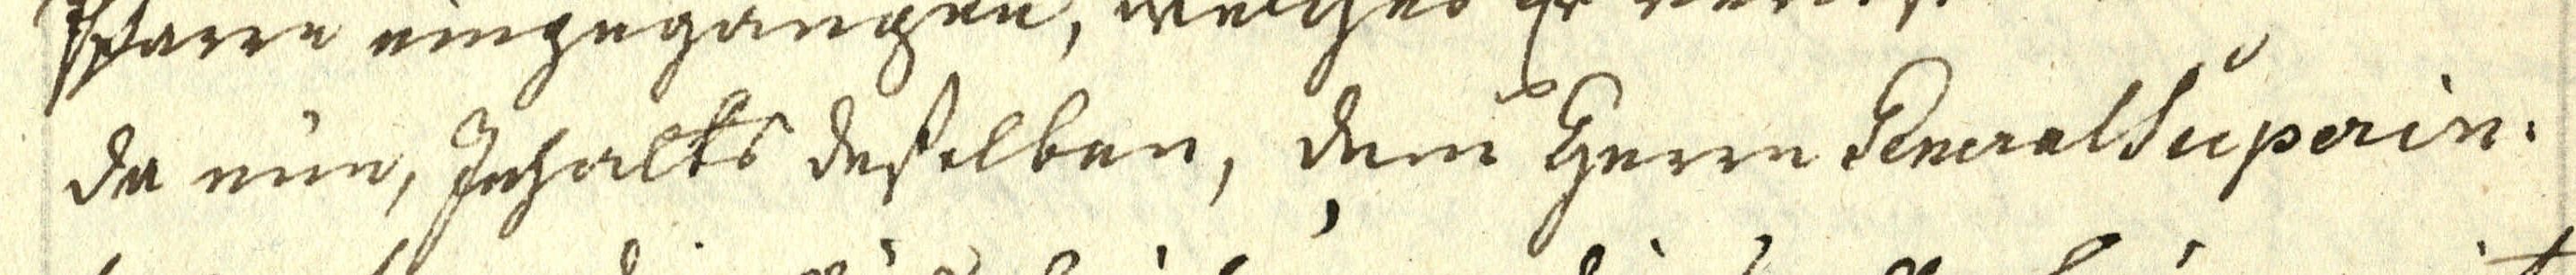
Da nun, Inhalts deßelben, dem Herrn GeneralSuperin¬
